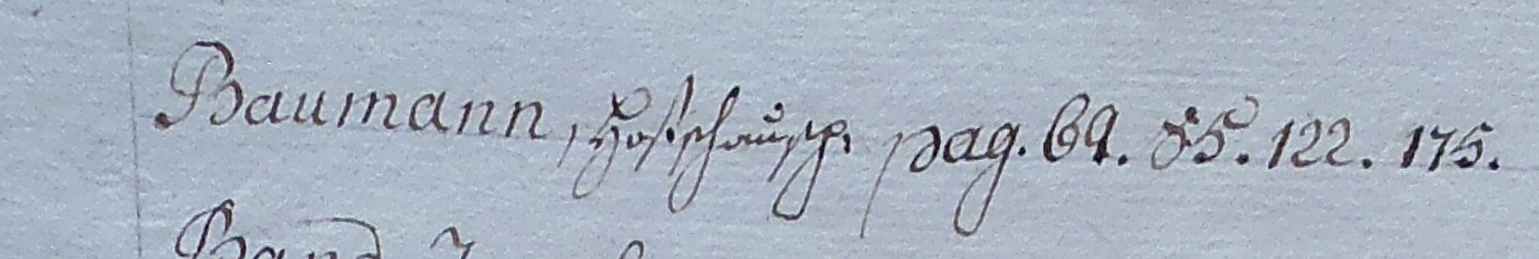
Baumann, Hofschausp. pag. 69. 85. 122. 175
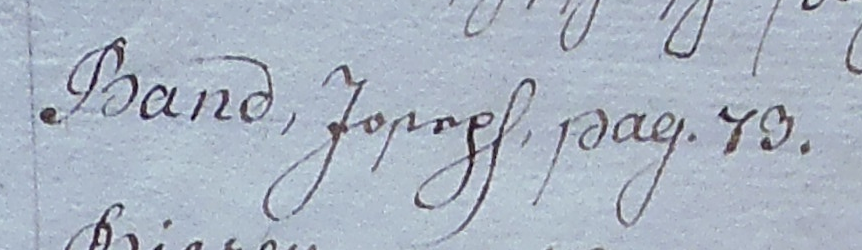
Band, Joseph, pag 73.
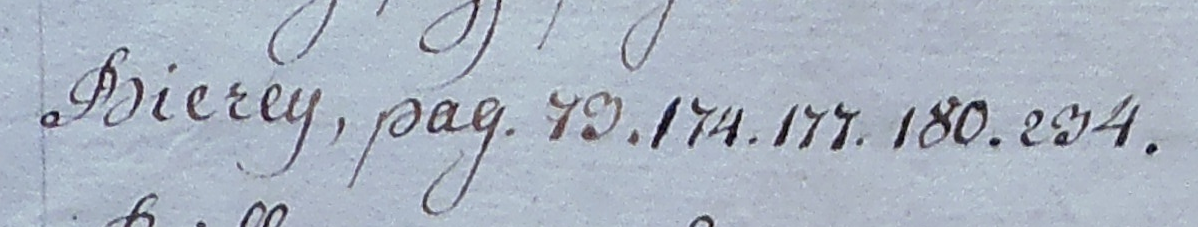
Bierey, pag. 73. 1
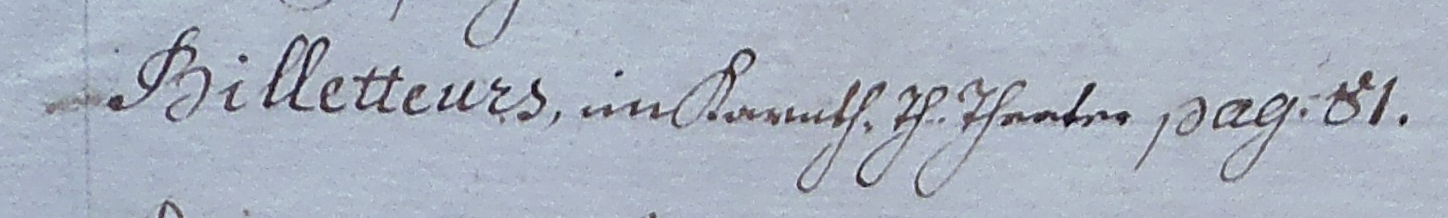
Billetteurs, im Karnth. Th. Theater pag. 81.
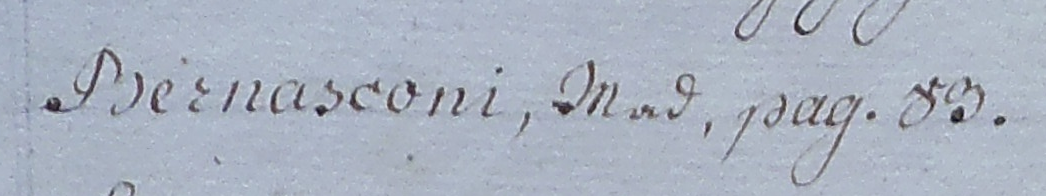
Bernasconi, Mad. pag. 83.
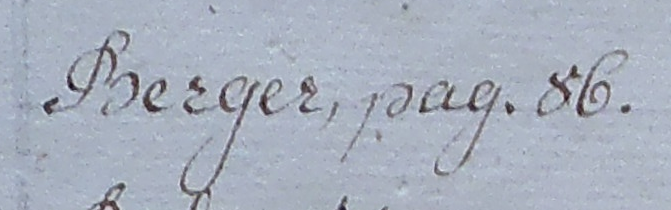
Berger, pag 86.
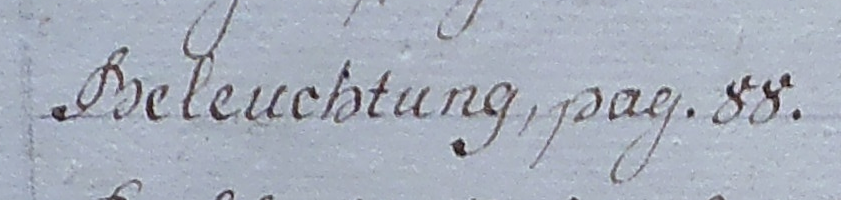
Beleuchtung, pag. 88.
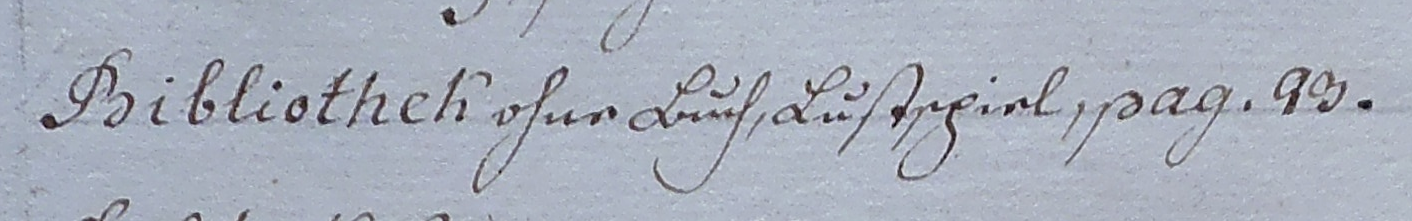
Bibliothek ohne Buch, Lustspiel, pag. 93.
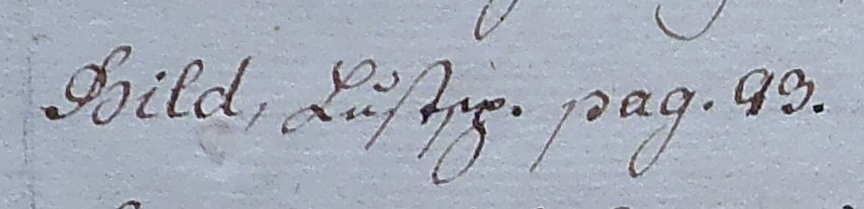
Bild, Lustsp. pag. 93.
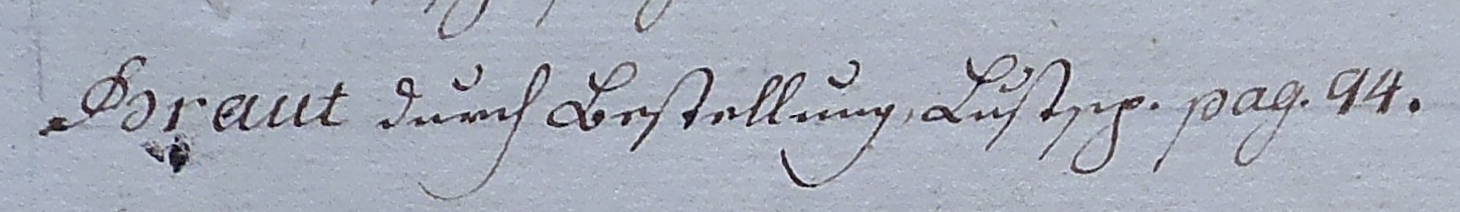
Braut durch Bestellung, Lustsp. pag 94.
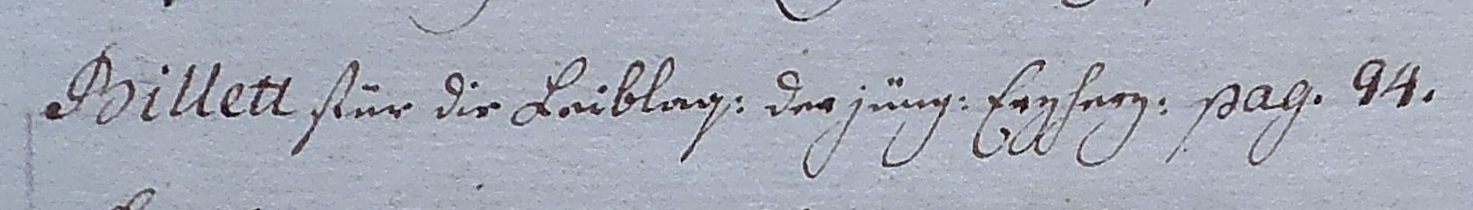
Billet für die Leiblaq: der jüng: Erzherz: pag. 94.
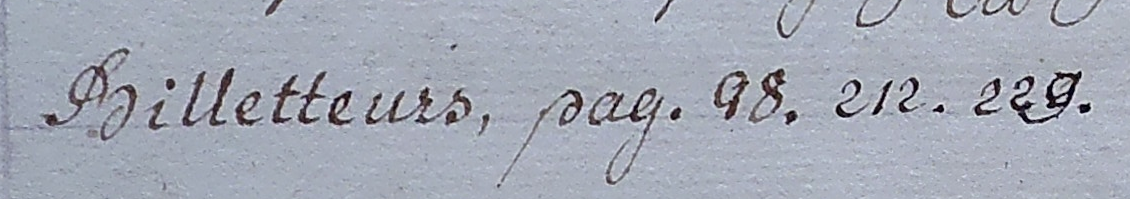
Billetteurs, pag. 98. 212. 229.
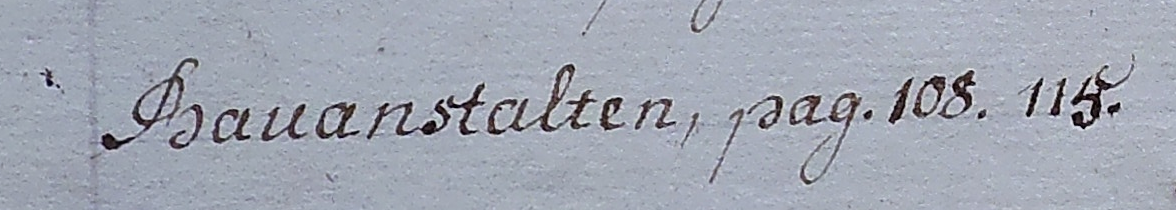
Bauanstalten, pag 108. 115.
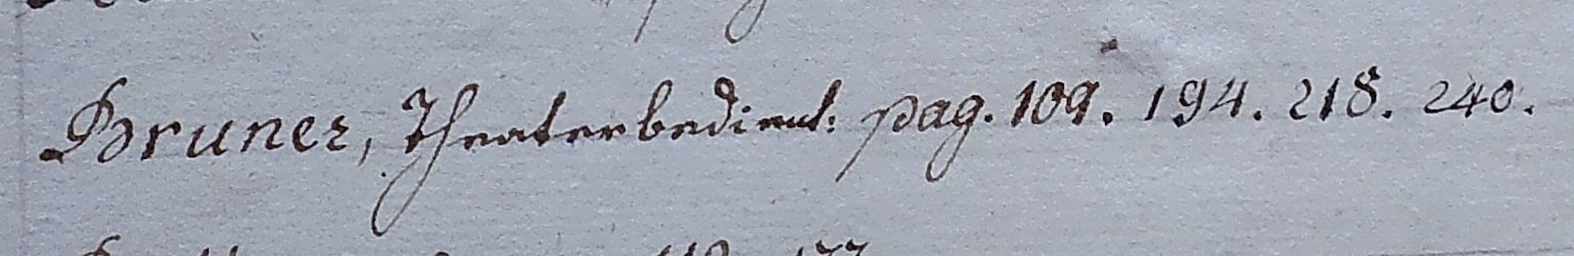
Bruner, Theaterbedient: pag. 109. 194. 218. 240.
